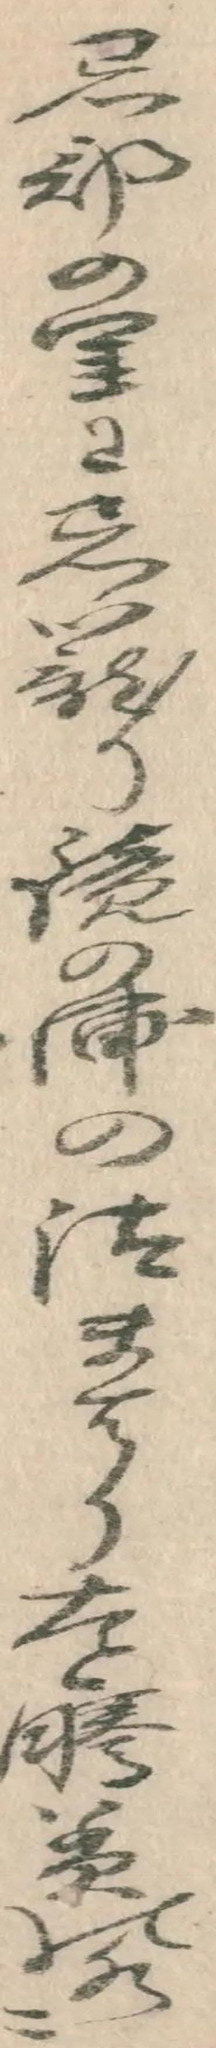忌部の里に忌籠り鏡の浦の清まはり遠騰美の水に
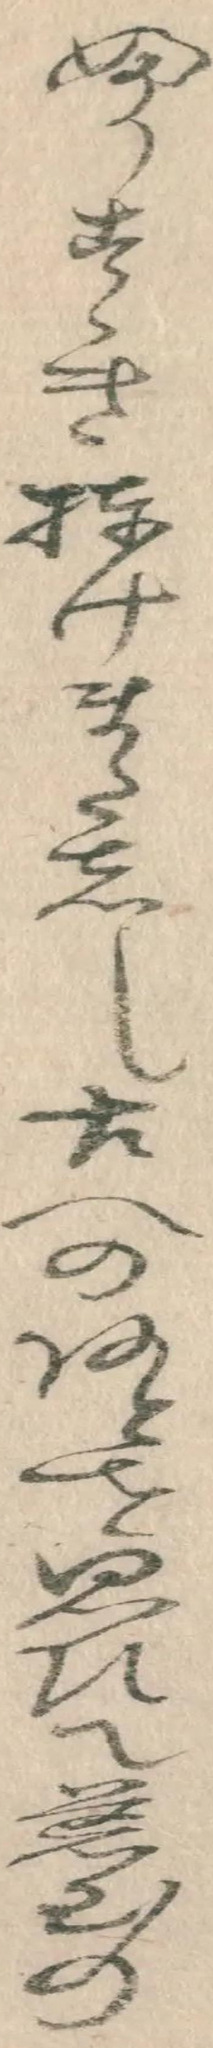ふりすゝき捧けまたしし古へのあとを思ひて荒玉の
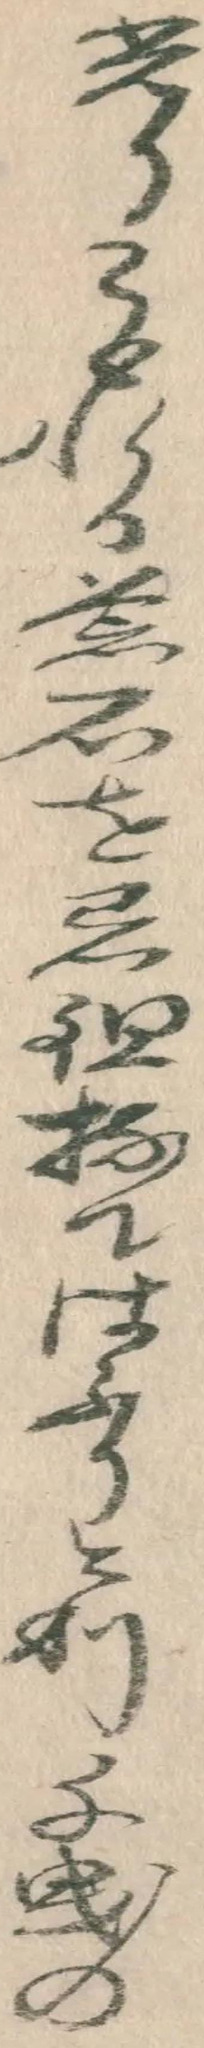光りこもれる荒石を忌鉏持てはふりとり千曳の
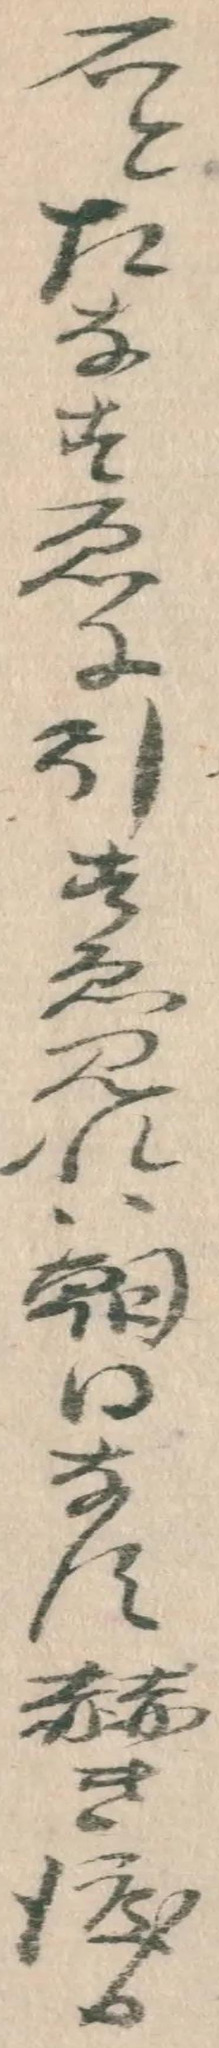石とたなすえに引すえ見れは朝日なす赫き渡る
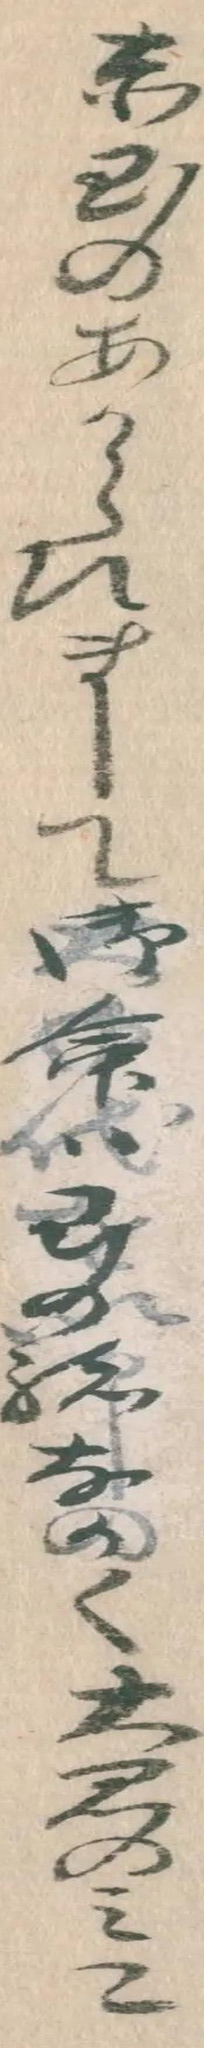赤玉のあからひまして御命は玉の緒なかく大君のみこ
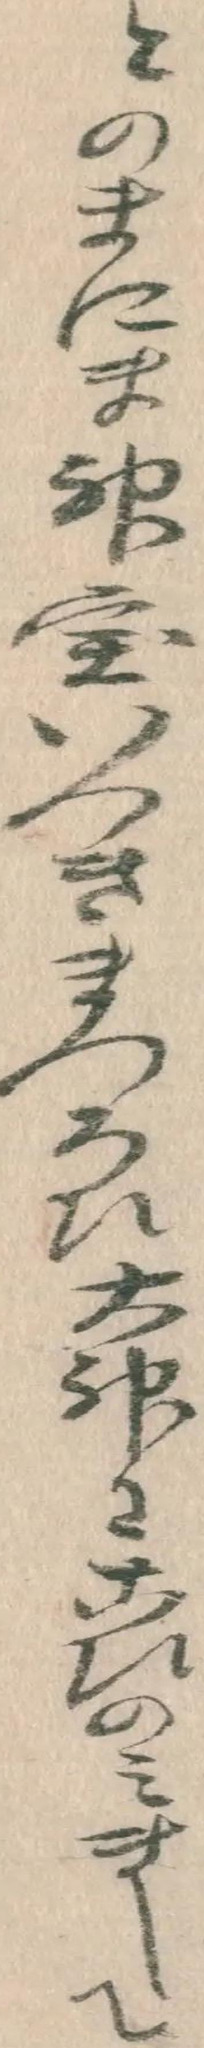とのまにま神宝いつきまつろひ大神にこひのみまして
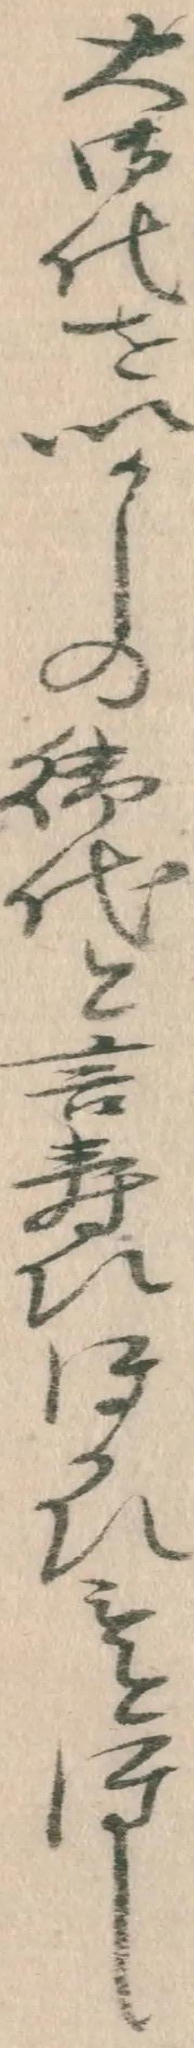大御代をいかしの御代と言寿ひほかひもとほし
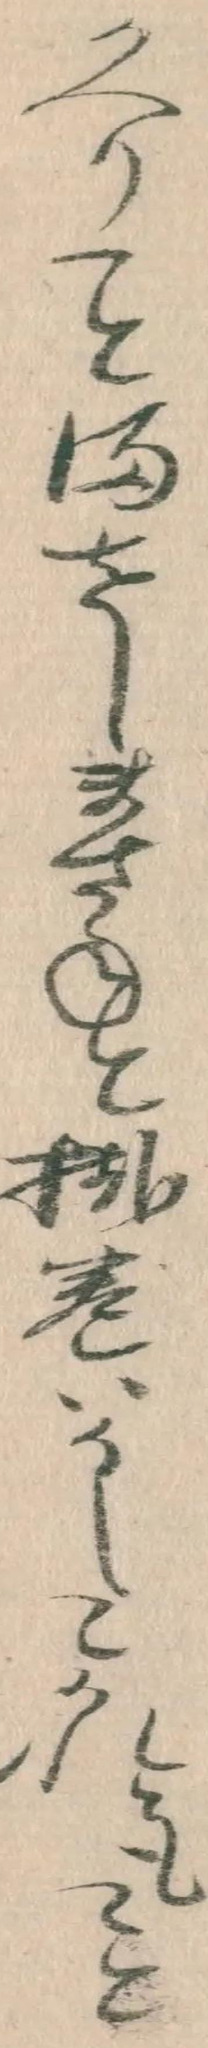かへりことまをしまさねと掛巻はかしこかれともこと
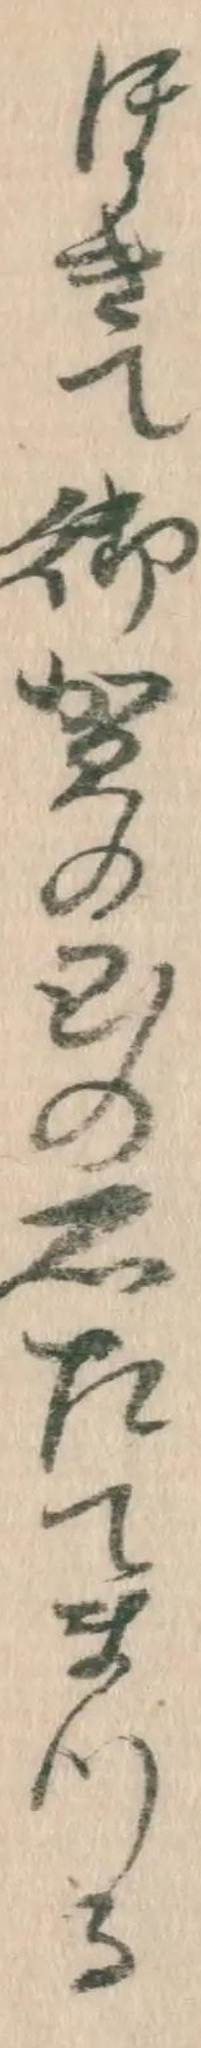ほきて御賀の玉の石たてまつる
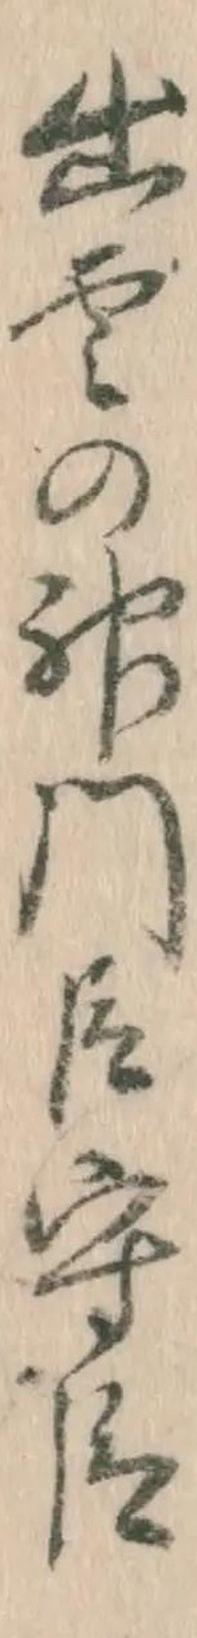出雲の神門臣守臣
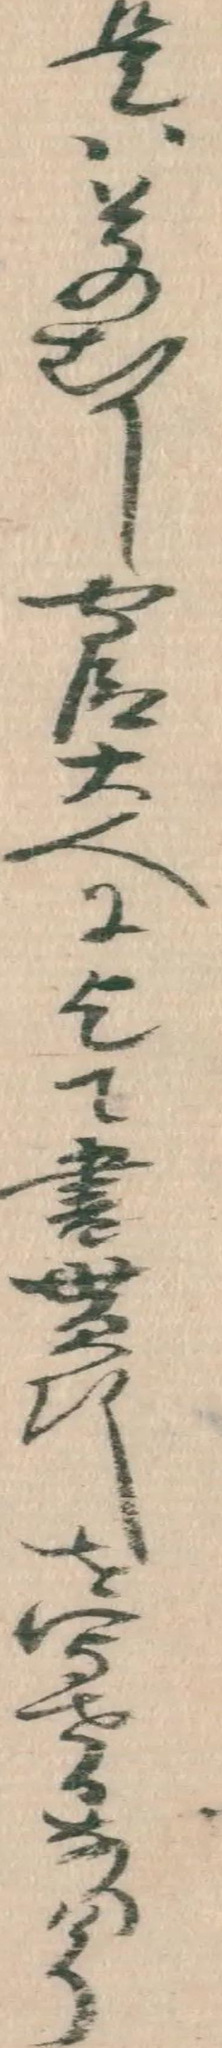是はそのむかし守臣大人に乞て書貰ひしを写せるなりけり
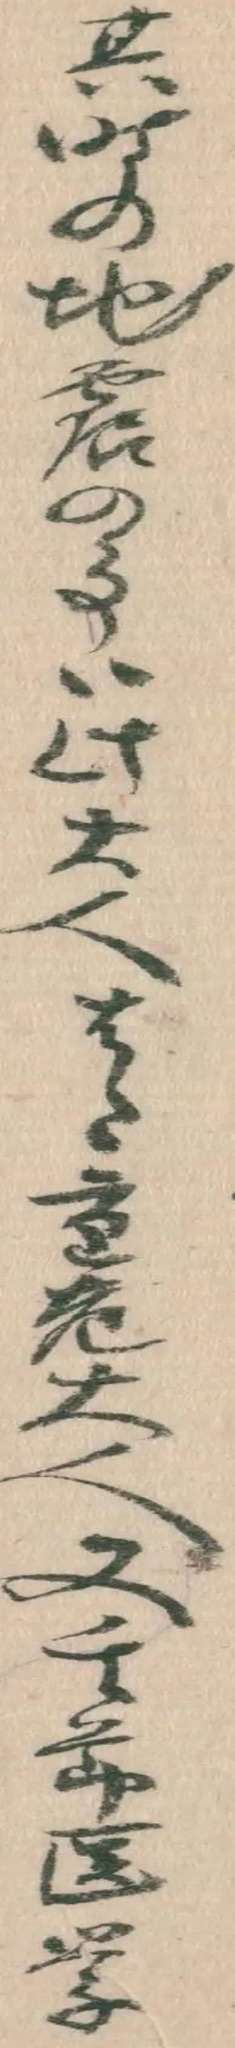其時の地震の事は此大人はた重老大人又其節医学
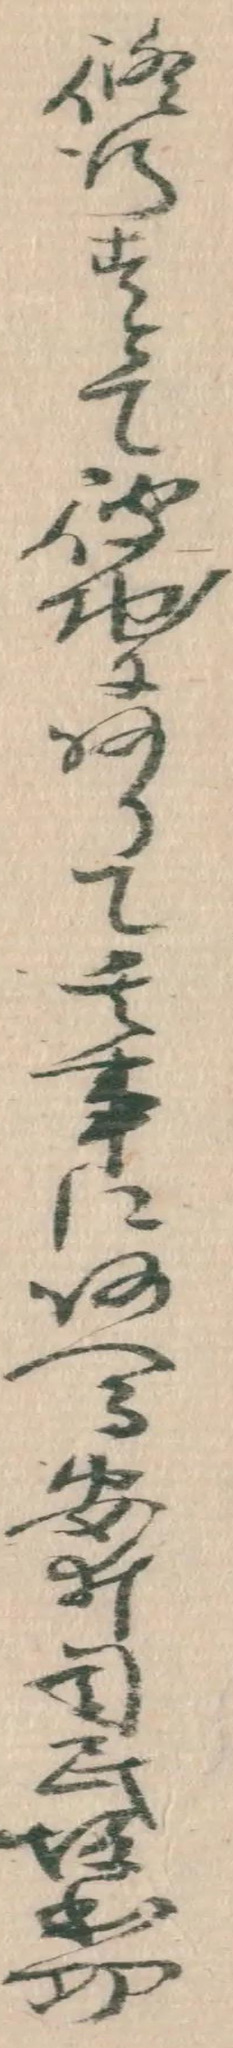修業すとて彼地にありて其事にあへる安井司民坂本功
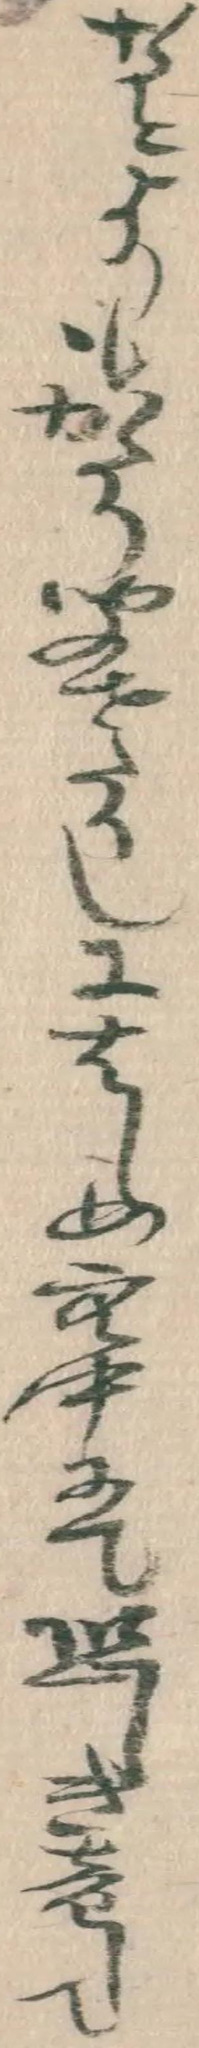なとよりもかたり聞せたりしにはしめ空中にて恐しき音して
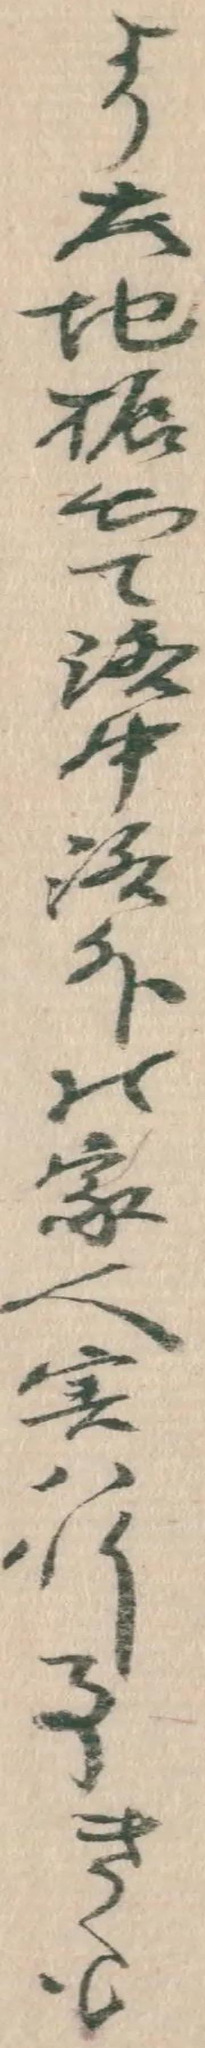より大地振出て洛中洛外の家人害はれし事きくも
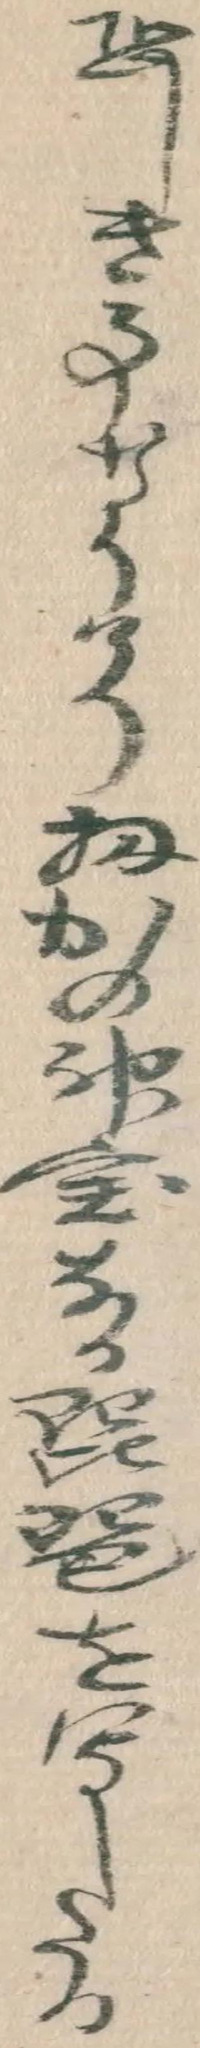恐しき事なりけり扨かの神宝なる琵琶を写したる
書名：出雲紀行. 20
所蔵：国立国会図書館 National Diet Library, JAPAN
